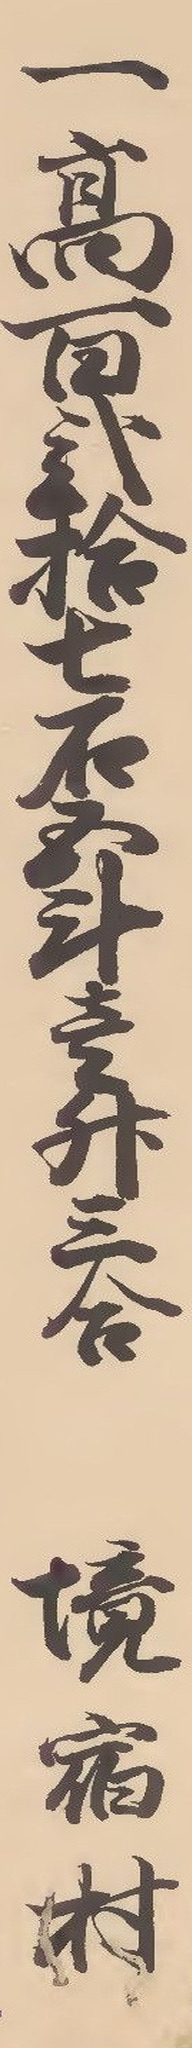一高百弐拾七石五斗壱升三合境宿村
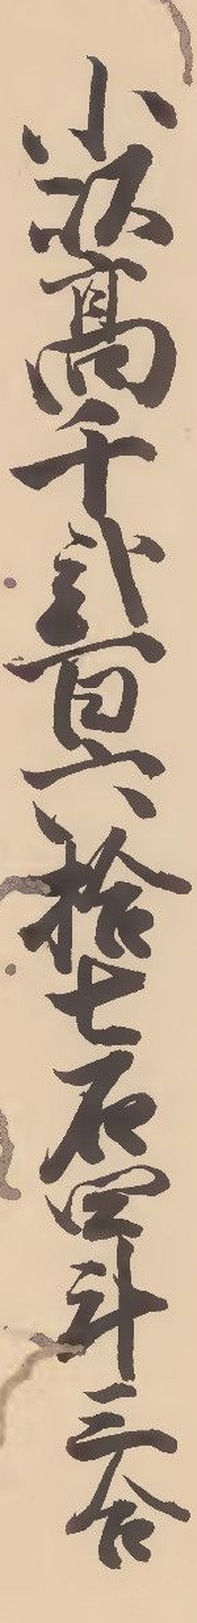小以高千弐百六拾七石四斗三合

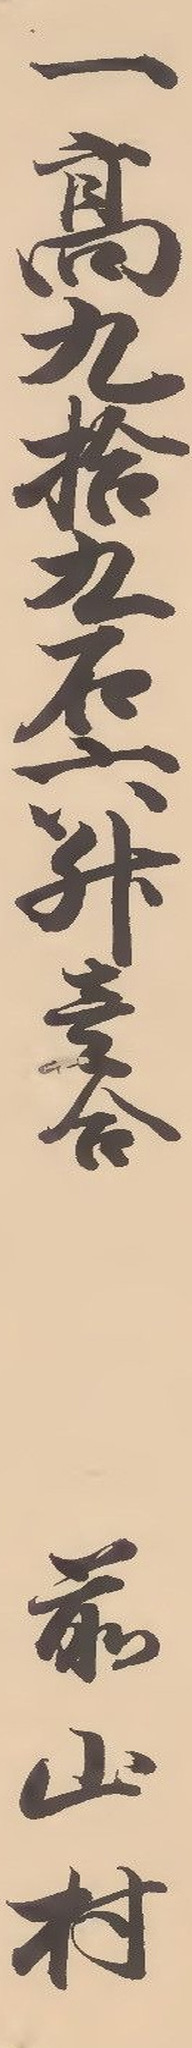一高九拾九石六升壱合前山村
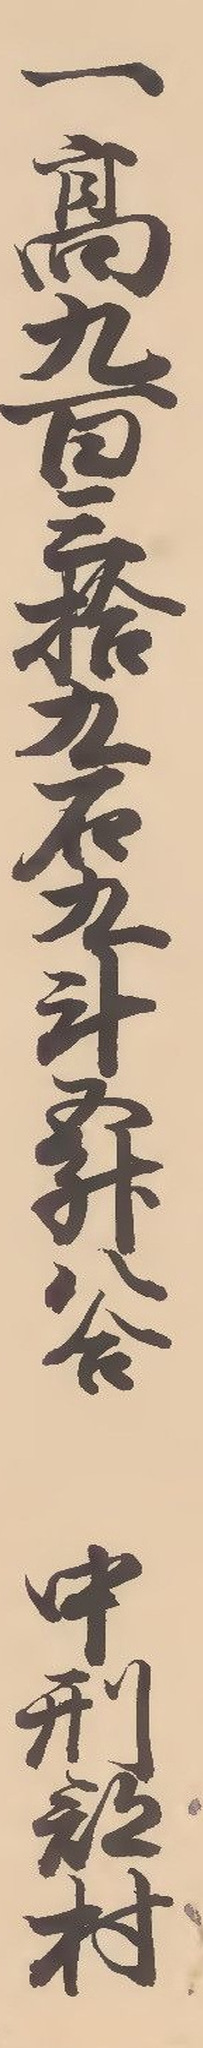一高九百三拾九石九斗五升八合中刑部村
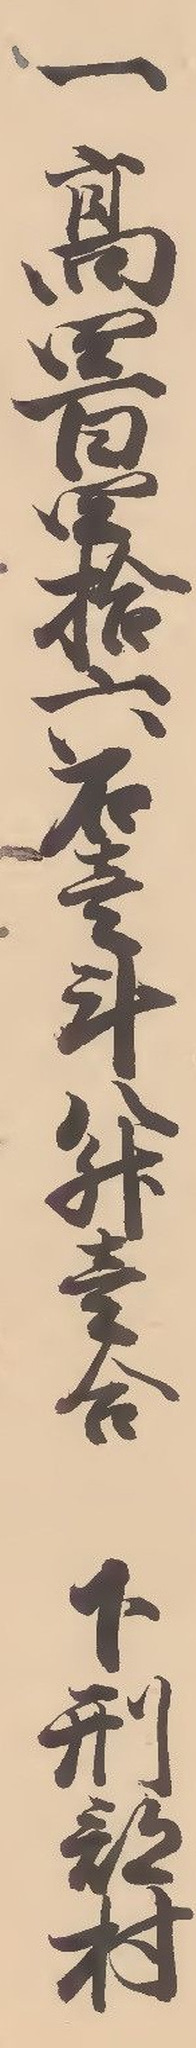一高四百四拾六石壱斗八升壱合下刑部村

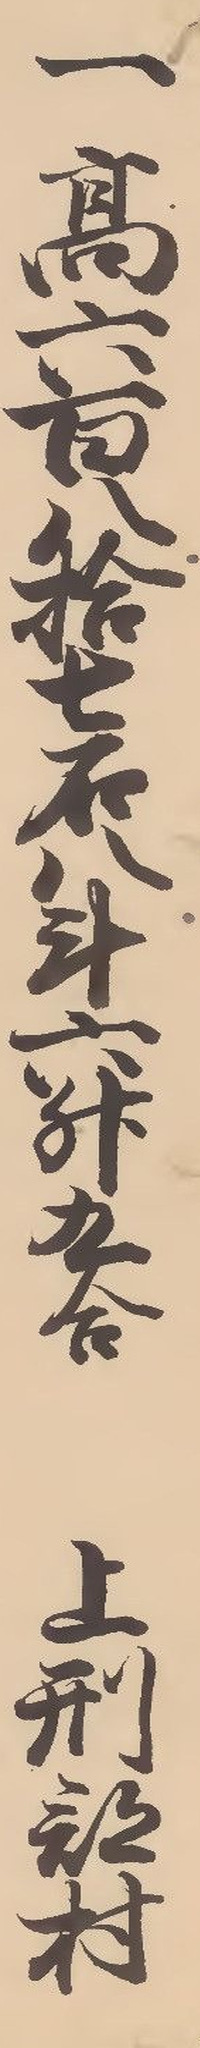一高六百八拾七石八斗六升九合上刑部村
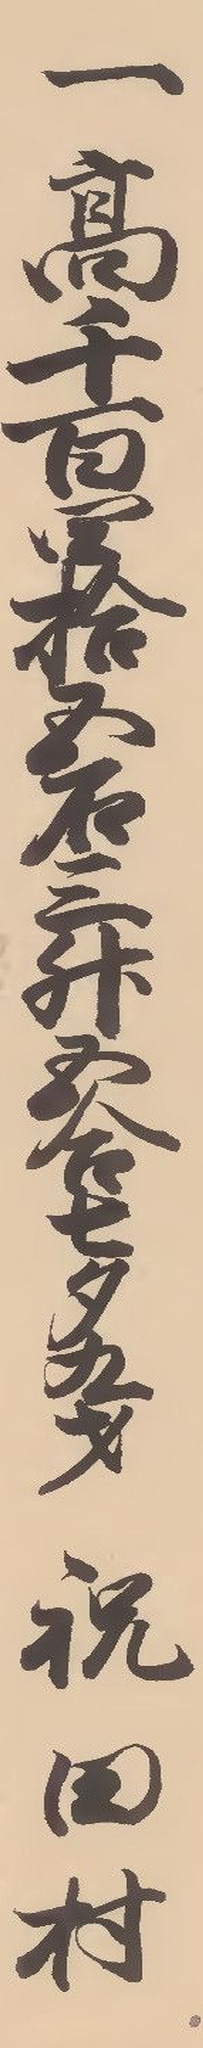一高千百四拾五石三升五合七勺九才祝田村
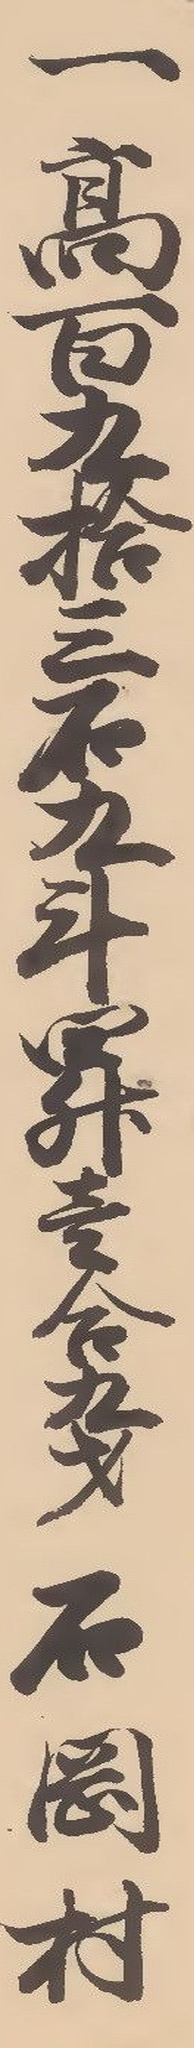一高百九拾三石九斗四升壱合九才石岡村
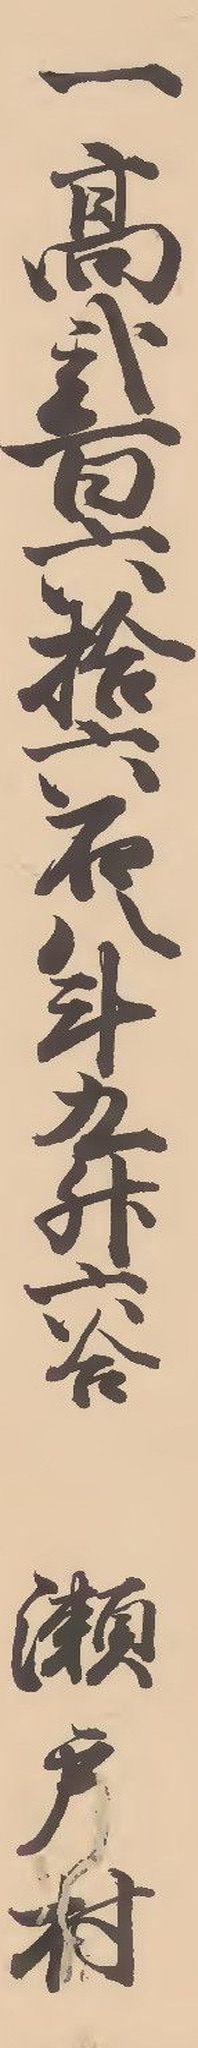一高弐百六拾六石八斗九升六谷瀬戸村
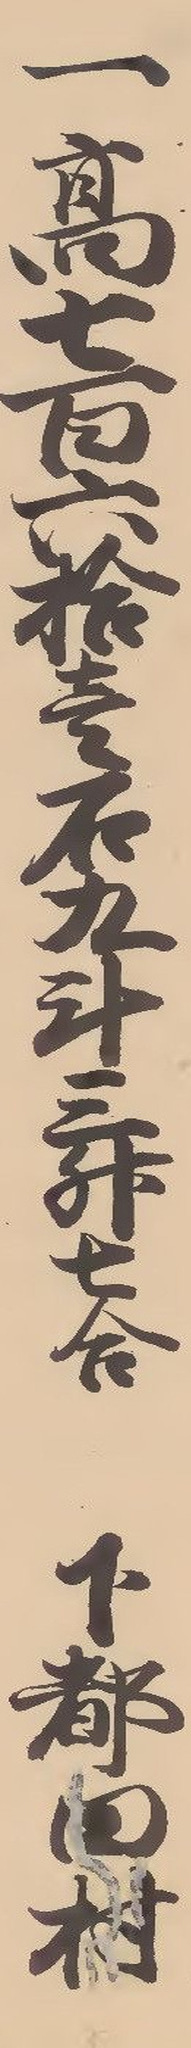一高七百六拾壱石九斗三升七合下都田村
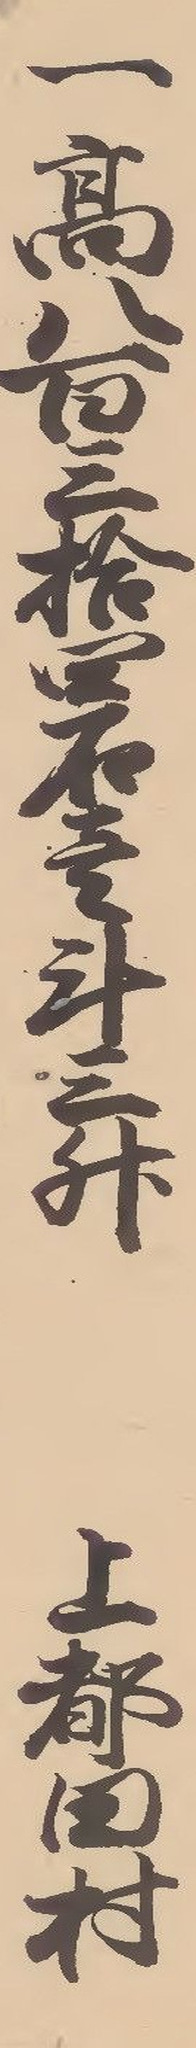一高八百三拾四石壱斗三升上都田村
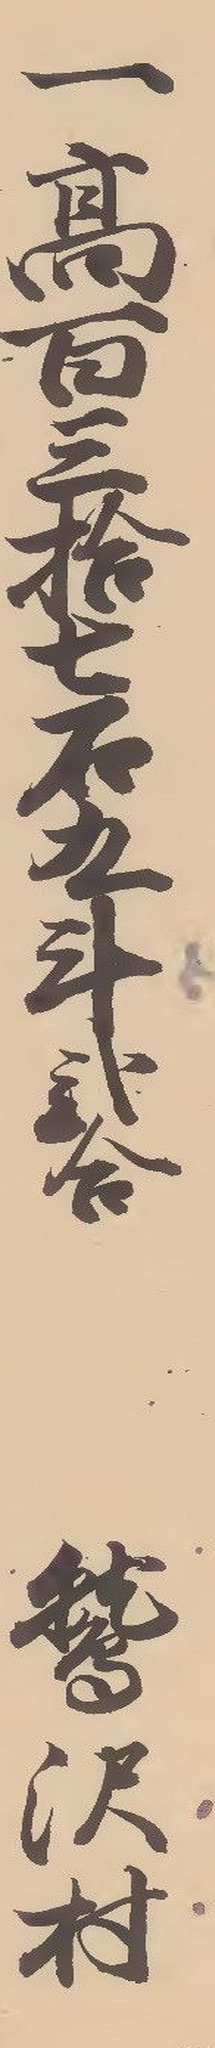一高百三拾七石九斗弐合鷲沢村
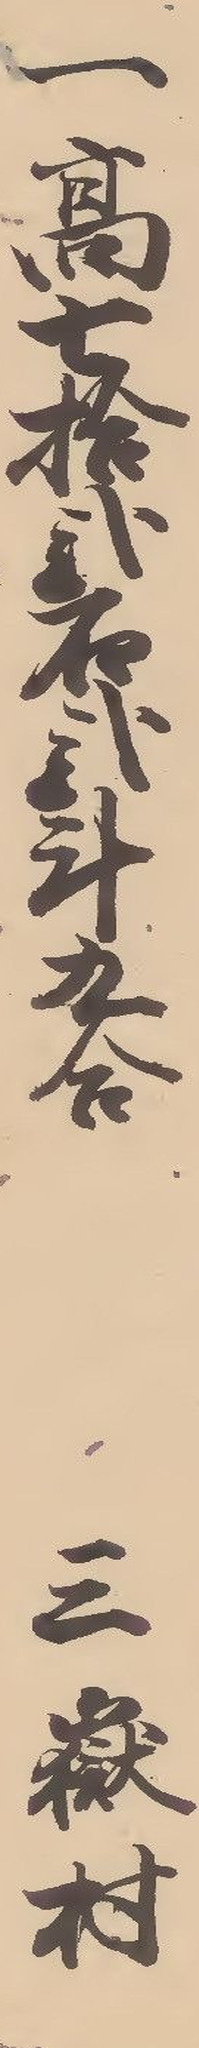一高七拾弐石弐斗九合三岳村

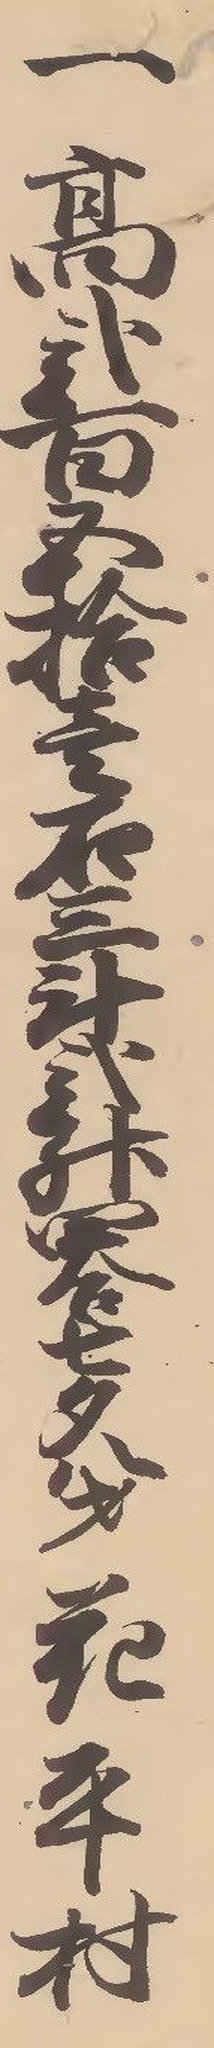一高弐百五拾壱石三斗弐升四合七勺八才花平村
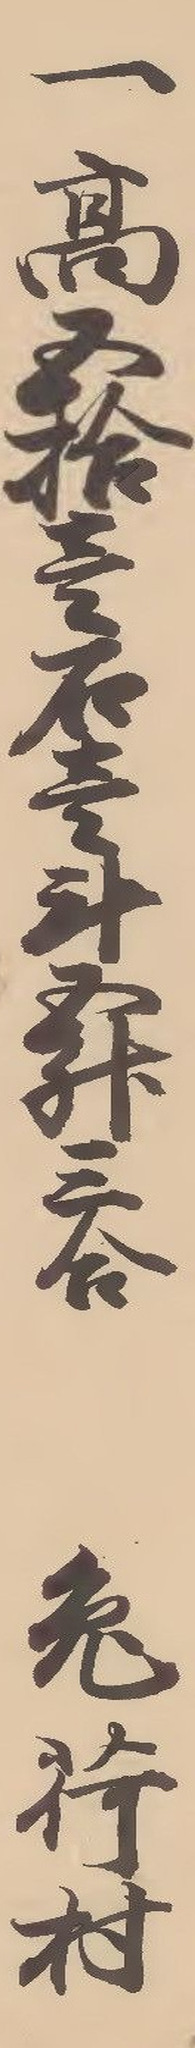一高五拾壱石壱斗五升三合兎荷村
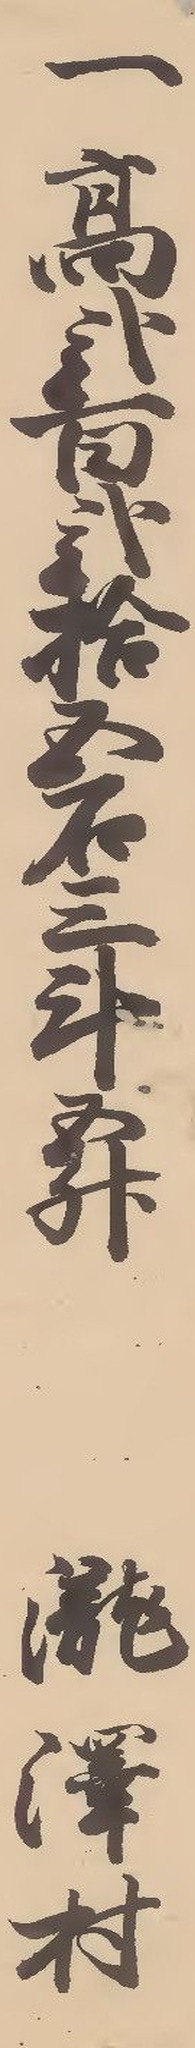一高弐百弐拾五石三斗五升滝沢村
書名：遠江国郷帳
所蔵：国立公文書館 National Archives of Japan
